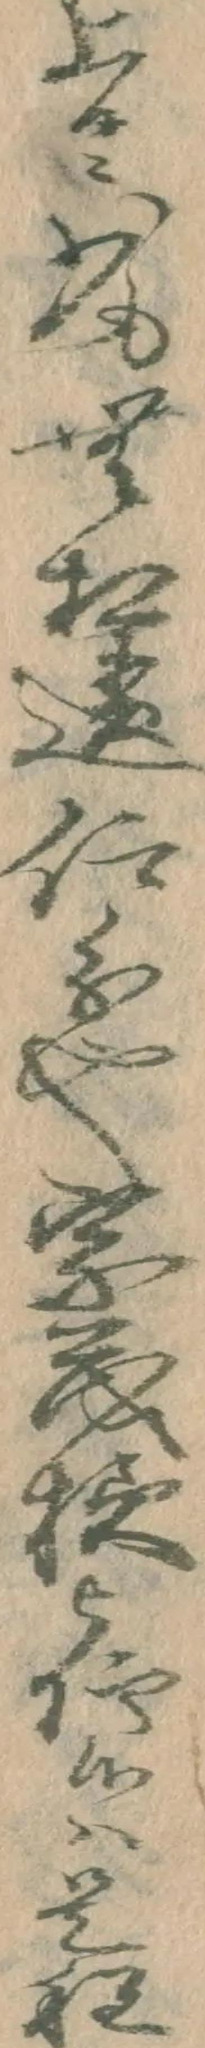上候に少も無相違仰分也宗茂様被仰候は是程
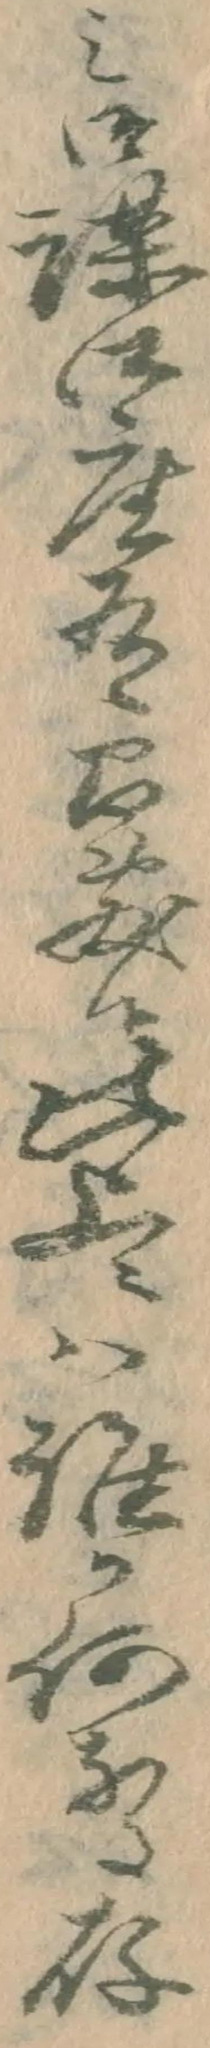之御謀御座有間敷候此上には誰か何なる存

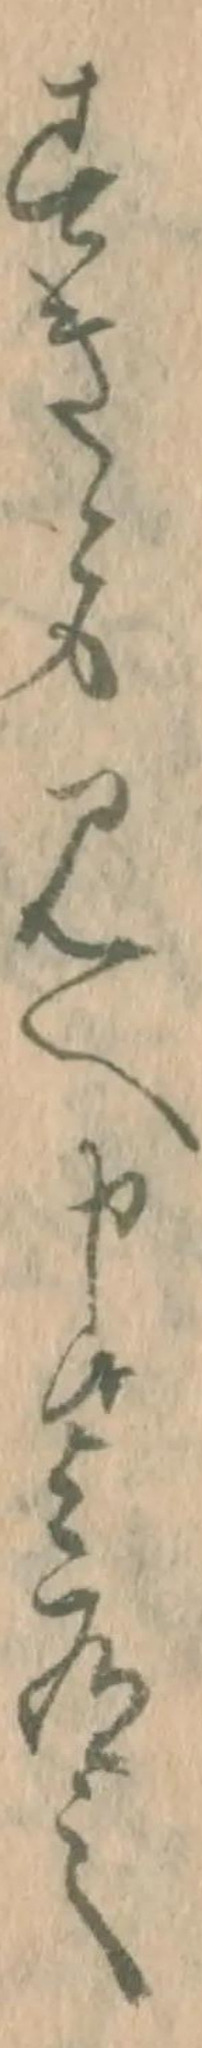春きとも見へ申候与有之
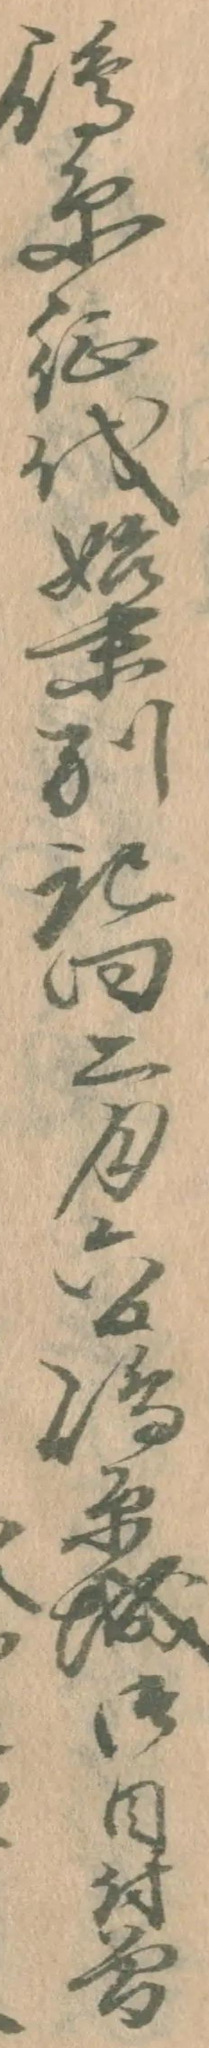島原征伐し始末別記曰二月六日島原城御目付曽
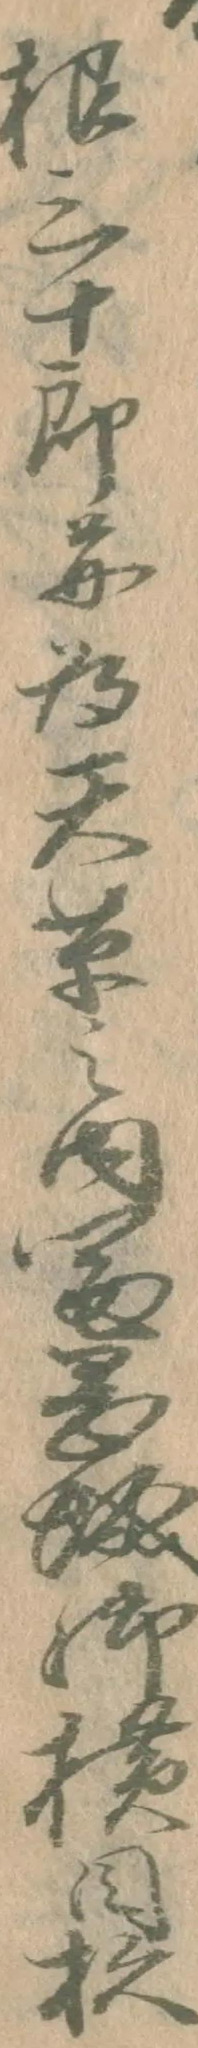根三十郎幷為天草之内冨岡城御横目杉
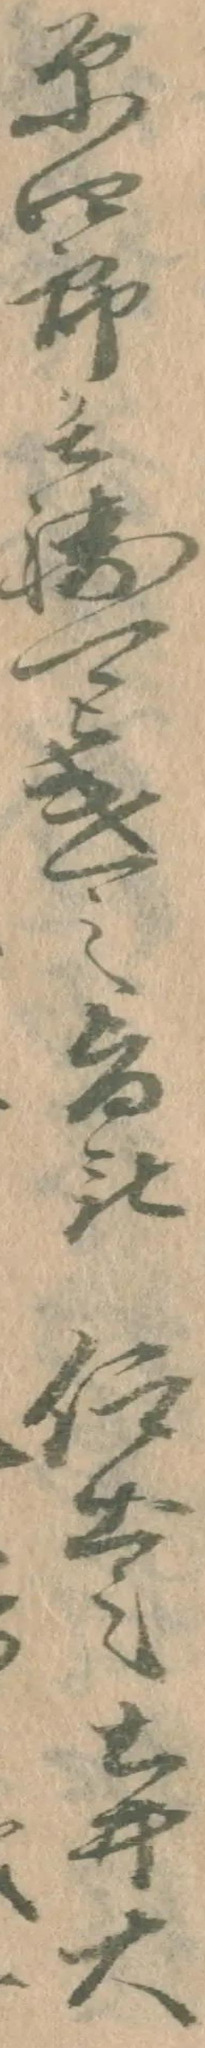原四郎兵衛可被遣之旨被仰出之土井大
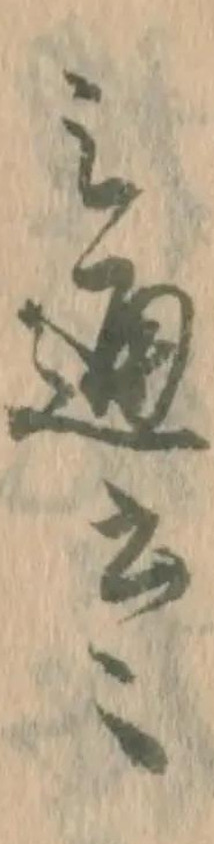之通云々
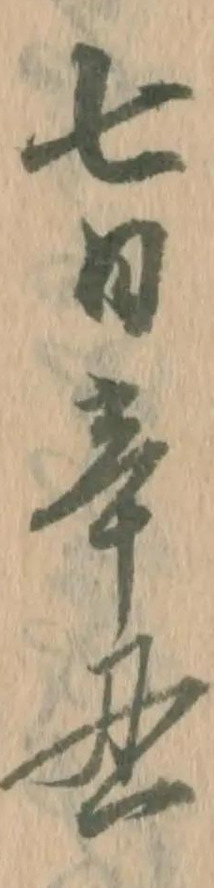七日辛丑
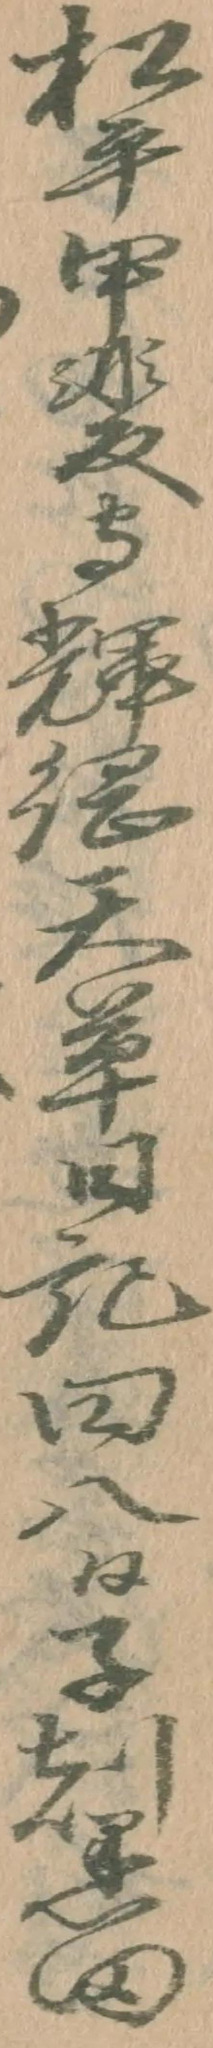松平甲斐守輝綱天草日記曰八日子刻黒田
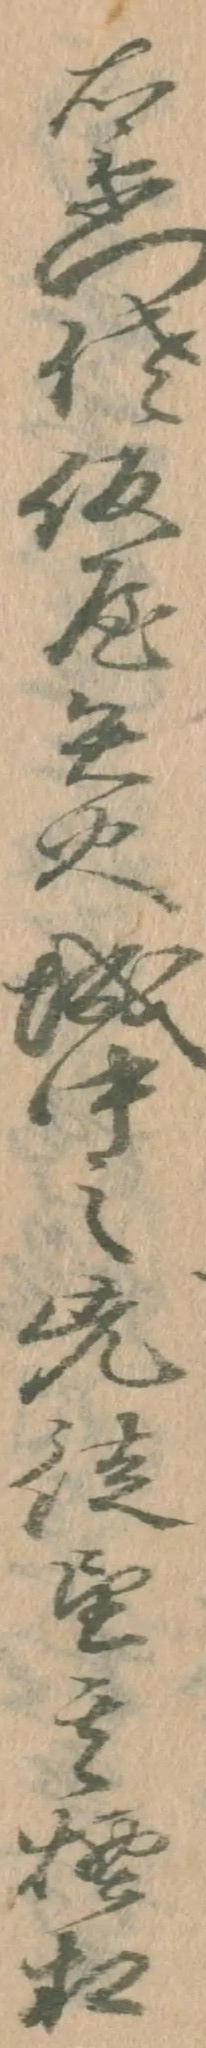右衛門佐仮屋矢火城中之凶徒望其煙相
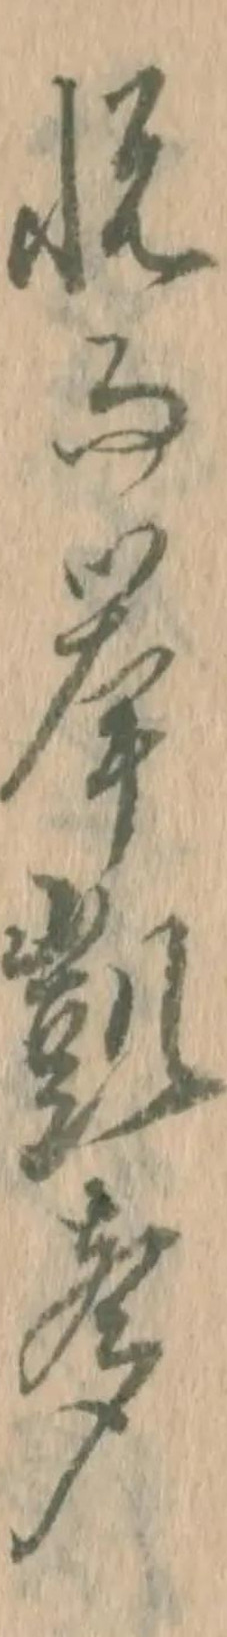悦而承凱声
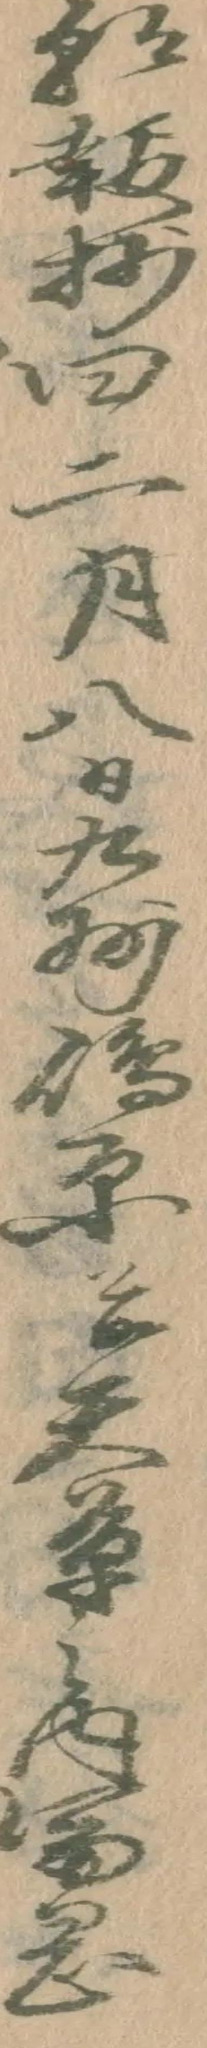朝報抄曰二月八日九州島原幷天草之内冨岡
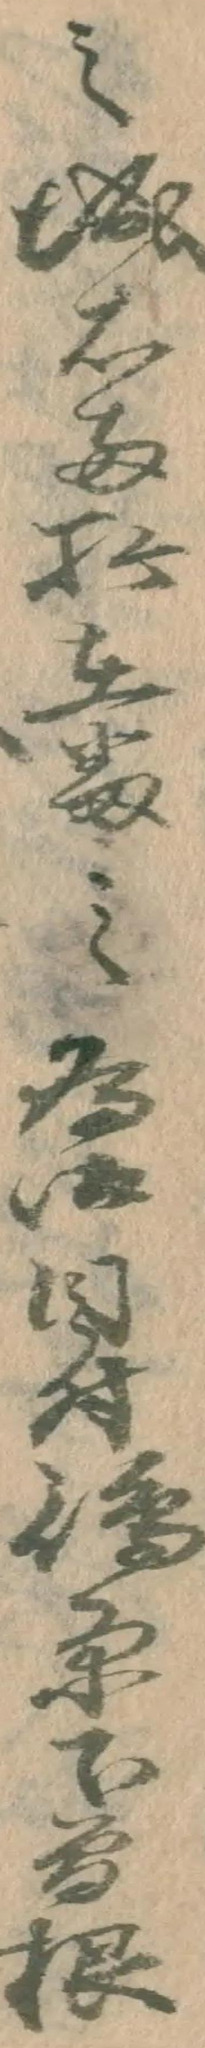之城右両所在番之為御目付島原下曽根
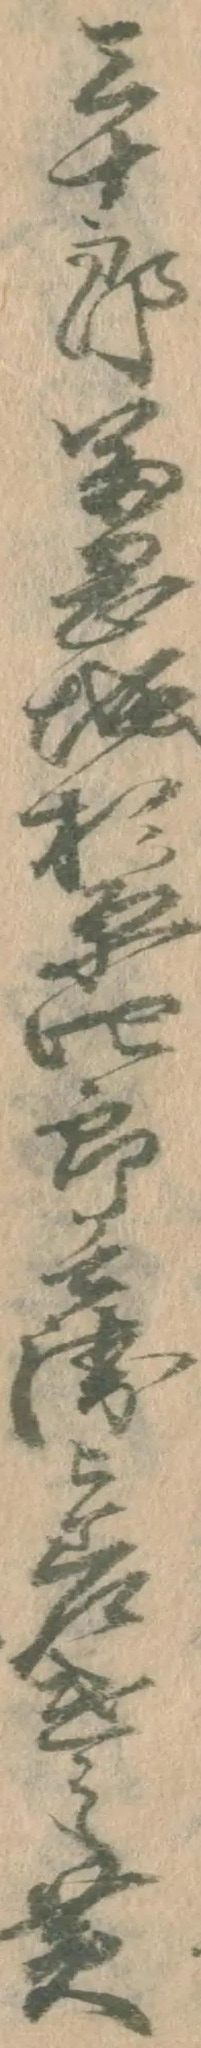三十郎冨岡城杉原四郎兵衛被着遣之黄
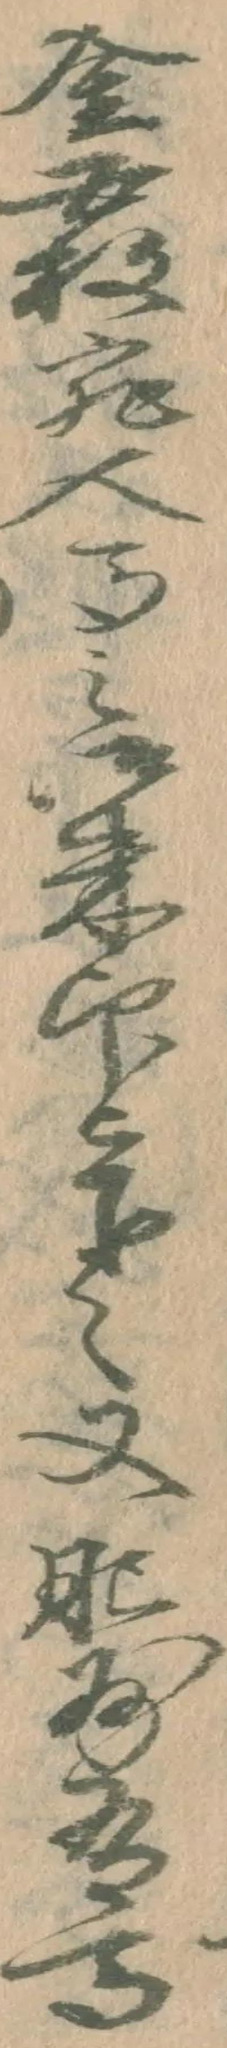金五枚宛人馬之御朱印被下之又肥前有馬
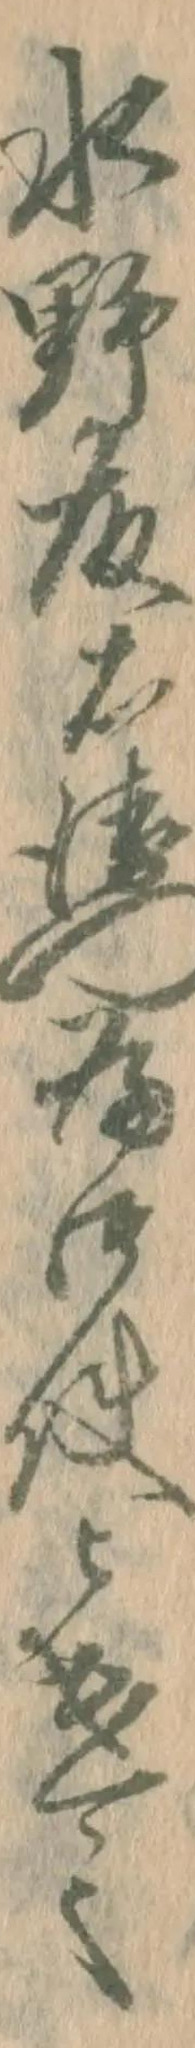水野藤右衛門為御使被遣也
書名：切支丹御退治記 49巻. [6]
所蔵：国立国会図書館 National Diet Library, JAPAN
